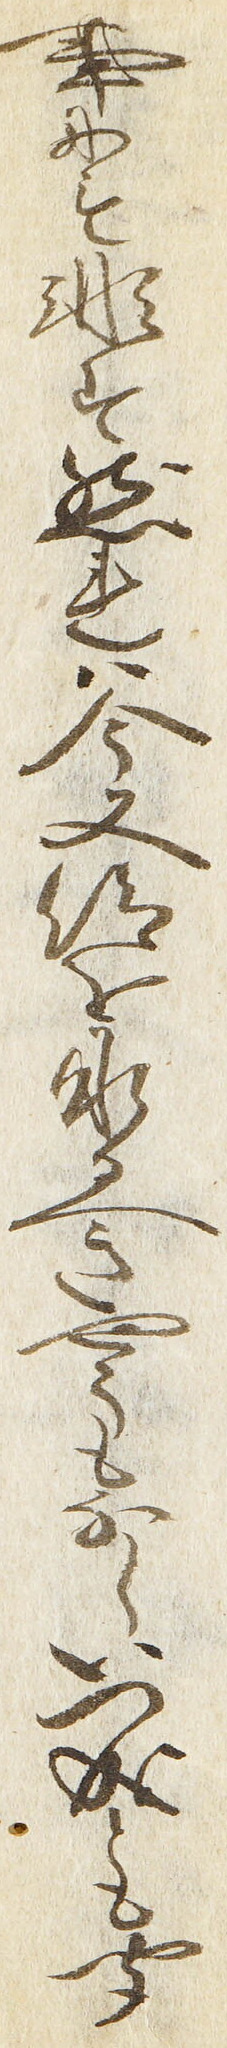事にも非す然れは今又仰を承るへきやうもなしいつ成とも聞
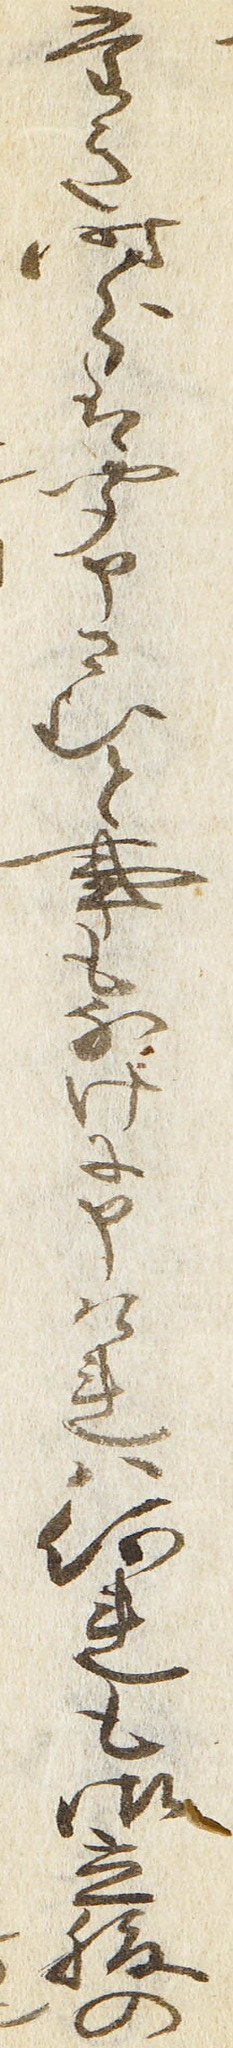たき時分は聞申さむと事もなげに申けれは何れも御立腹の
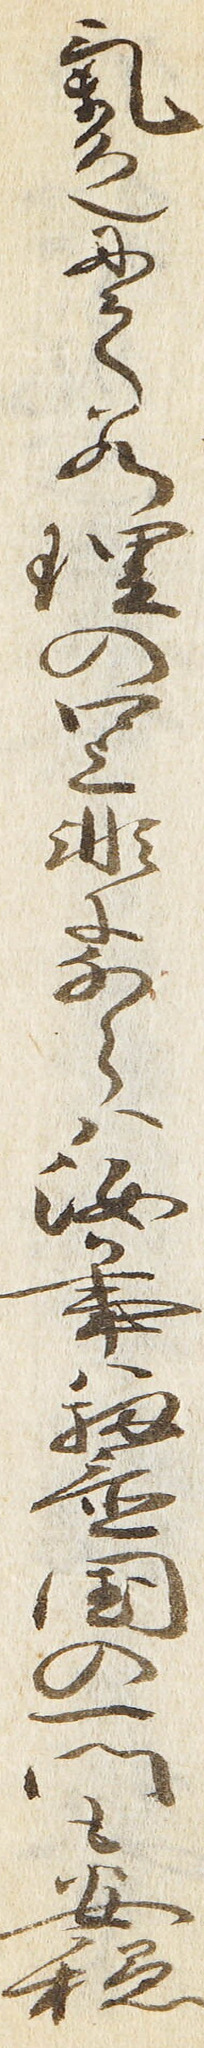気色にて若理の口上非にならは汝か事は扨置国の一門も安穏
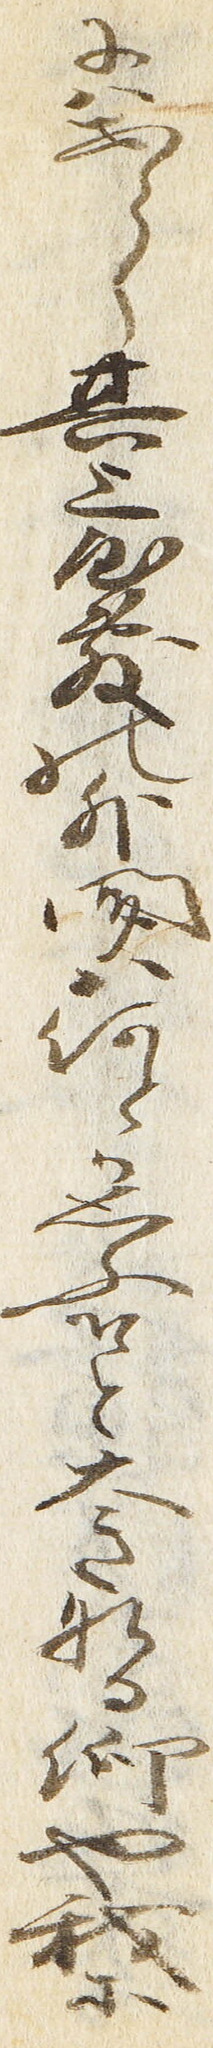にはあらし其上屋敷の外聞は何とか思ふそと大きなる仰也我等
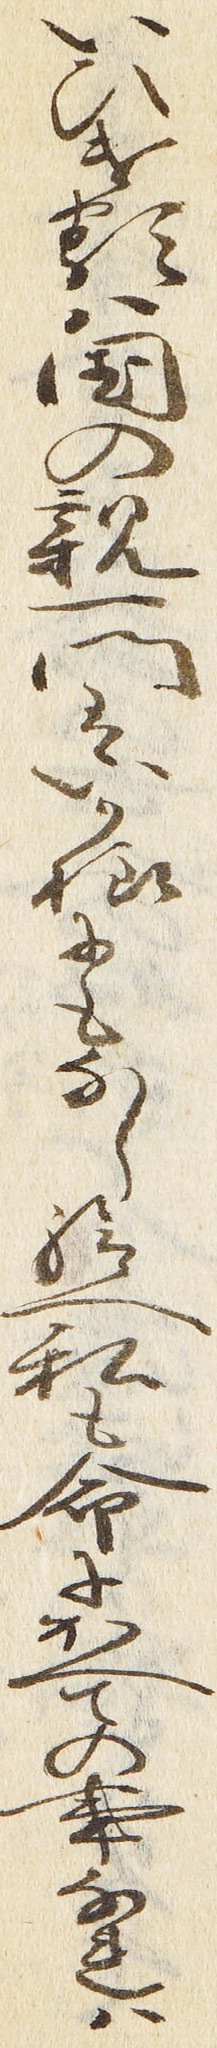いひけるは国の親一門はいか様にもなし給へ私も命にかへての事なれは
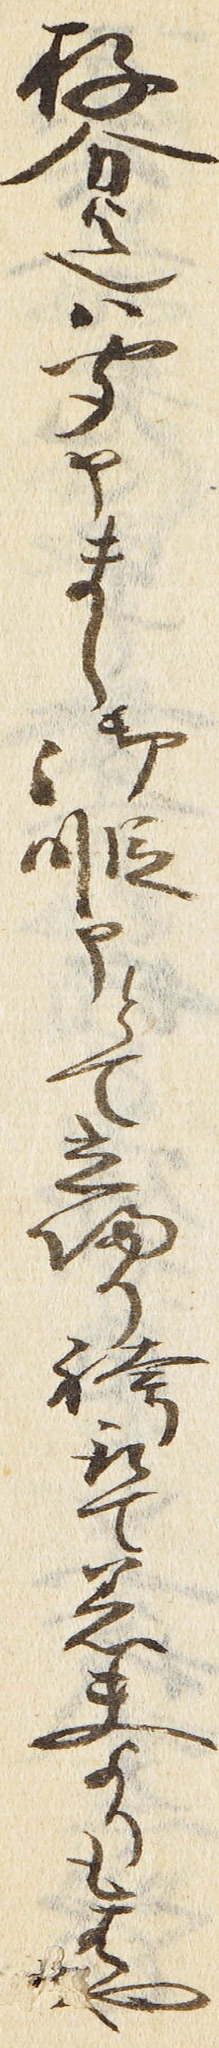存分迄は聞申まし御暇申とて立帰り袴取て着夫よりもはや
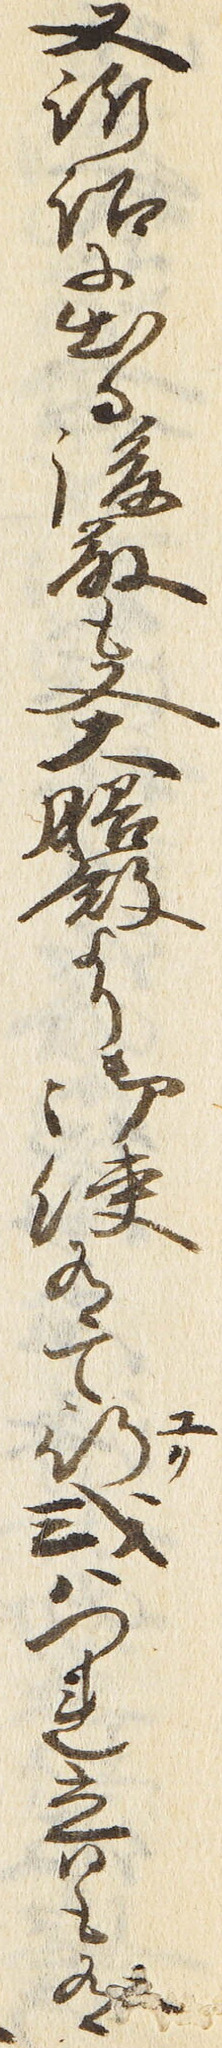又訴訟に出る後藤も又大膳殿より御使有て行或はつれ立日も有
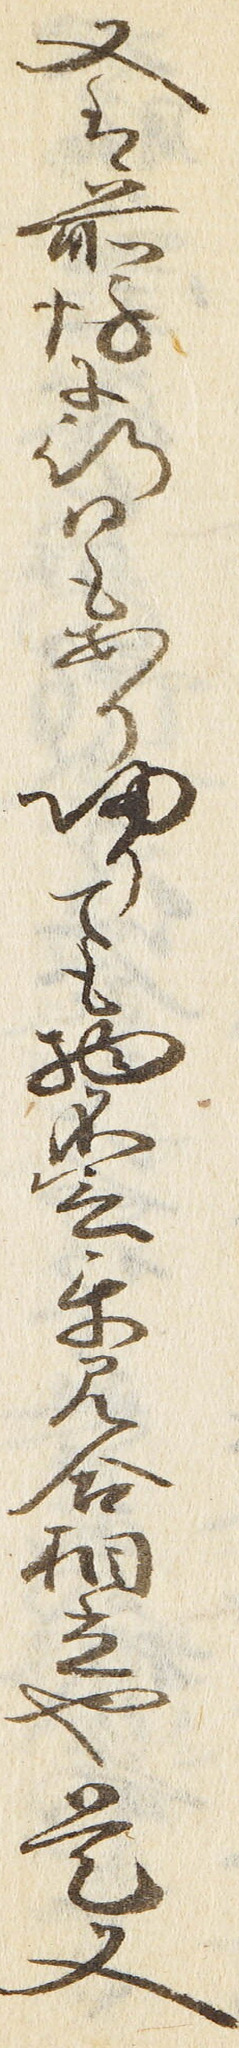又は前後に行日もあり帰りても物不言互見合相立也是又
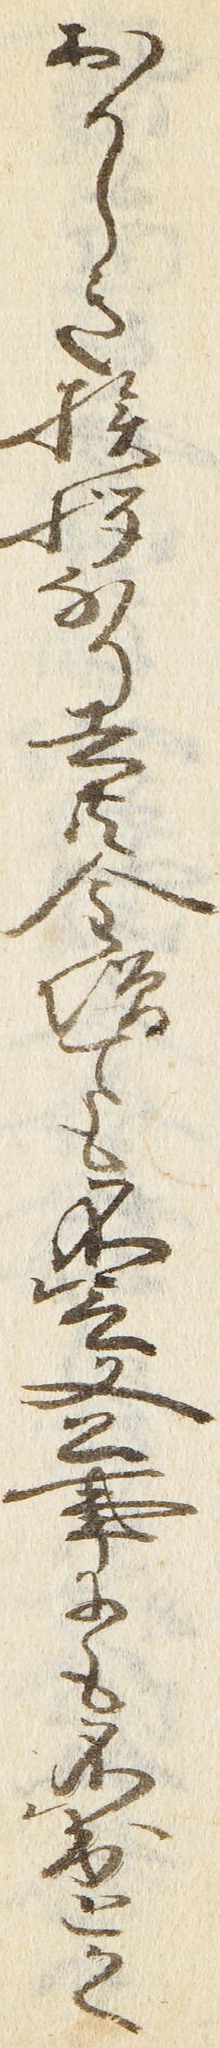おかしき挨拶なり去共金増ても不言又公事にも不出とて
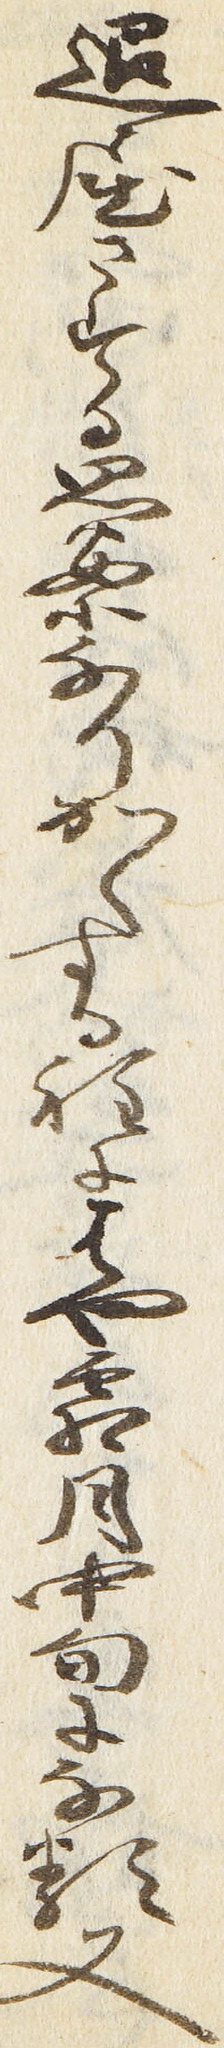退屈さする思案なりかくする程にはや霜月中旬になる又
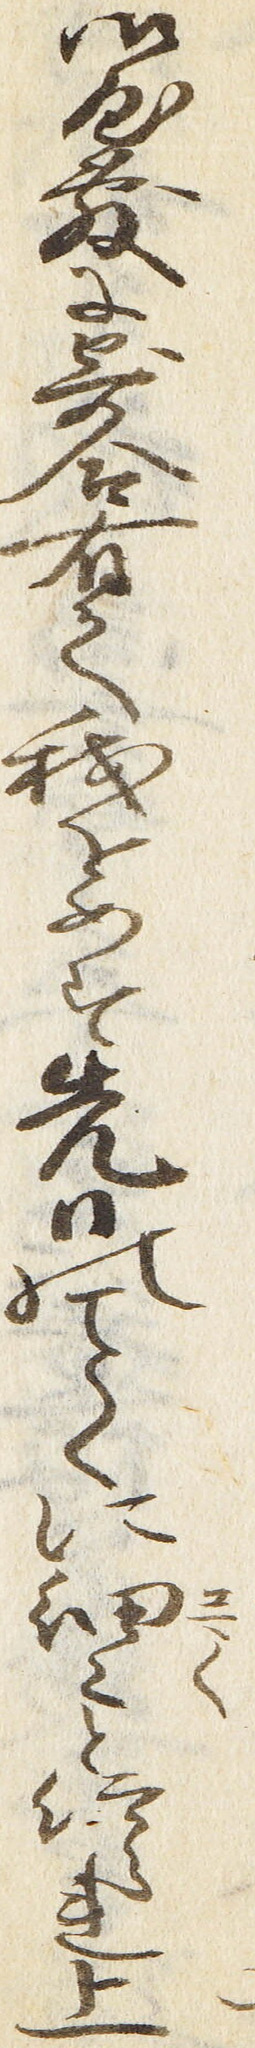御屋敷に寄合有て我をめす先日のことくに細々と仰られ上
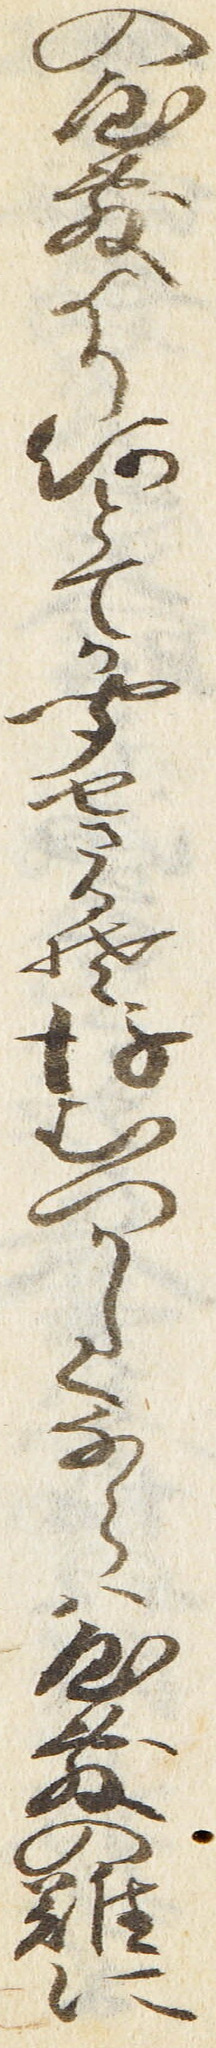の屋敷より何とてか聞せさるそ後むつかしくならは屋敷の難に
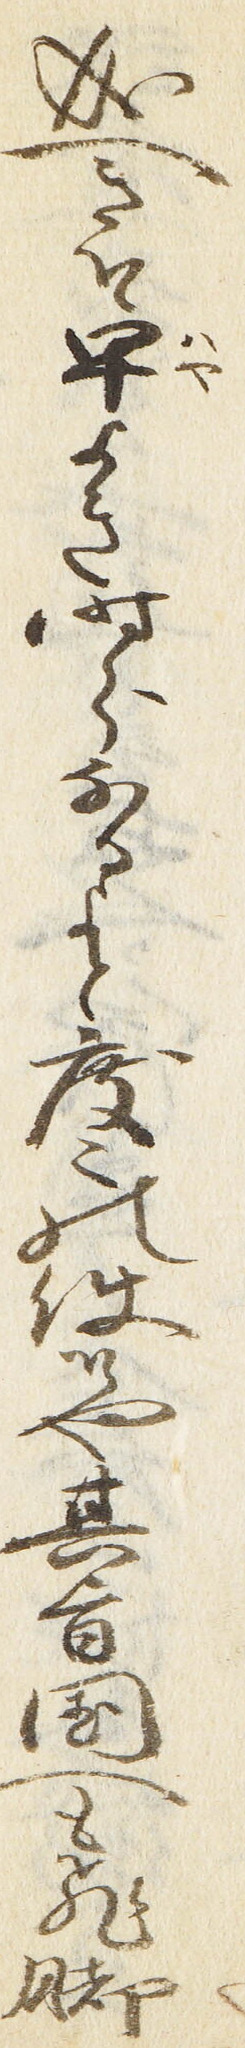成へきそ早よき時分なるよと度々の使そや其旨国へも飛脚
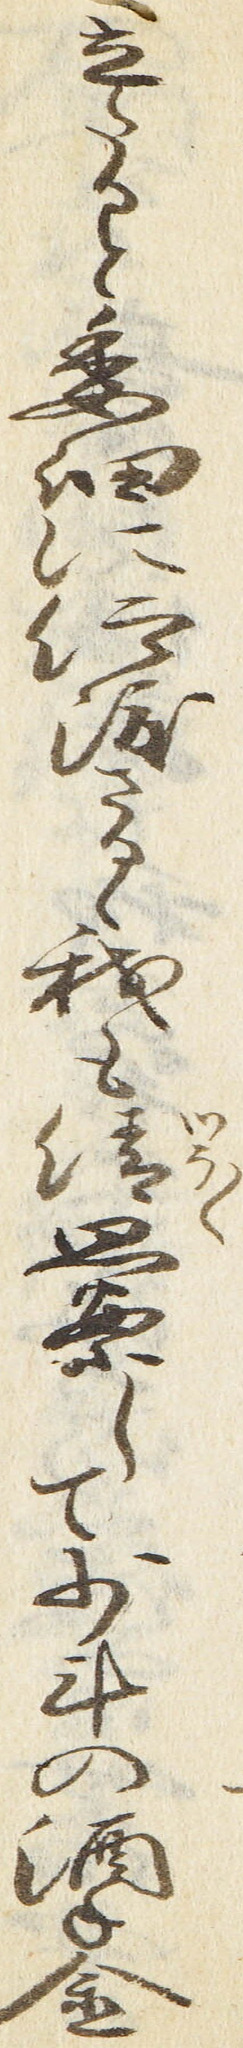立たると委細に仰渡さるゝ我も倩思案して少斗の酒手金
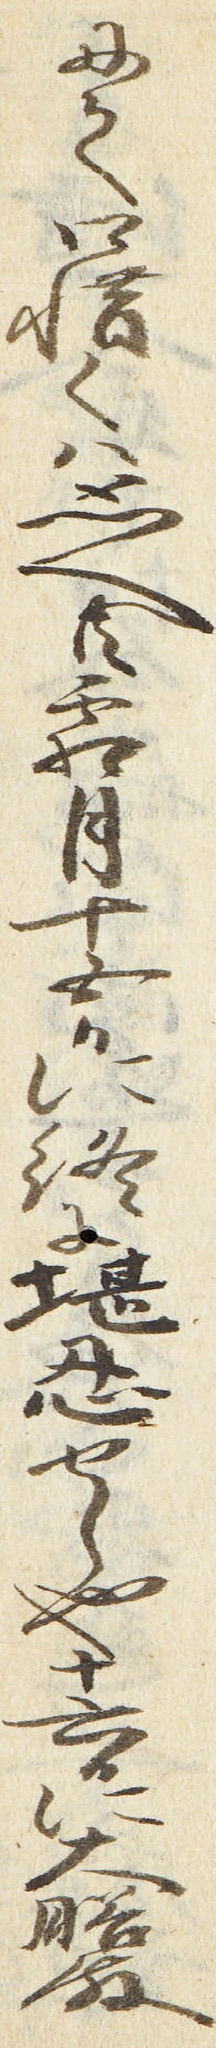にて口惜くは思へ共霜月十五日に終に堪忍せし也十六日に大膳殿

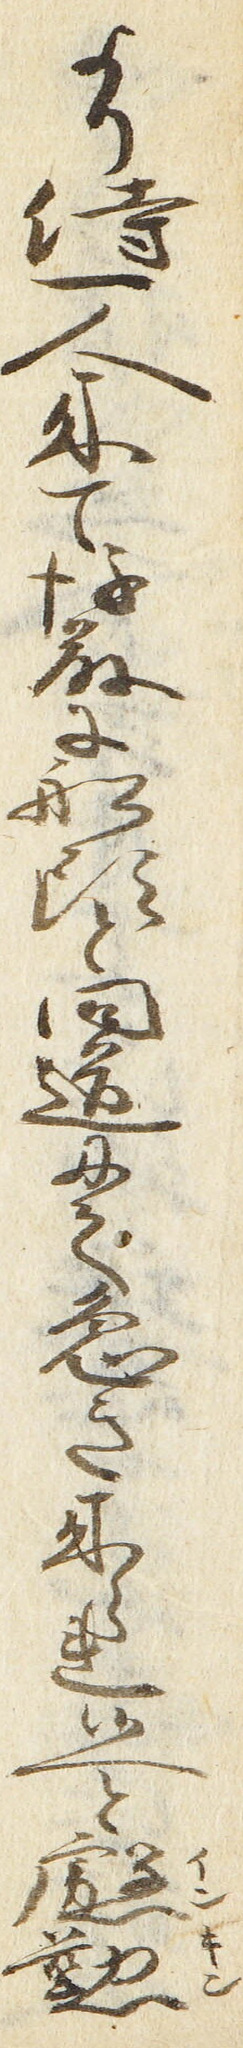より侍一人来て後藤に船頭と同道にて急き来られ候へと慇懃
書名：海陸世話日記
